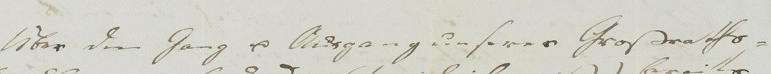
Über den Gang & Ausgang unserer Großraths-
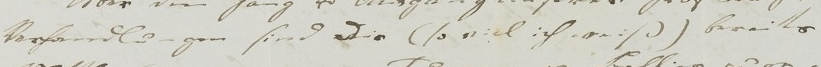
Verhandlungen sind Dir (so viel ich weiß) bereits
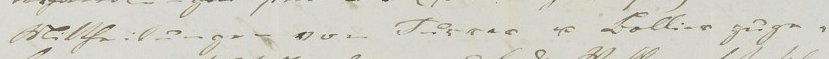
Mittheilungen von Furrer & Bollier zuge-
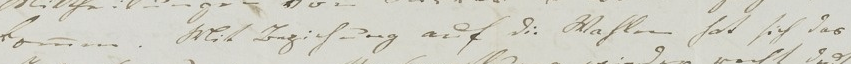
kommen. Mit Beziehung auf die Wahlen hat sich das
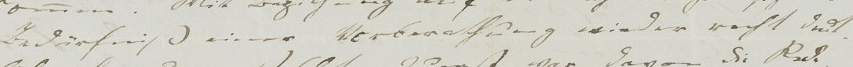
Bedürfniß einer Vorberathung wieder recht deut-
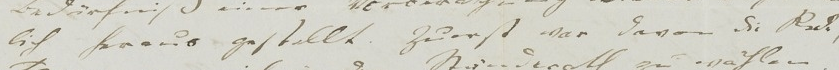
lich heraus gestellt. Zuerst war davon die Rede,
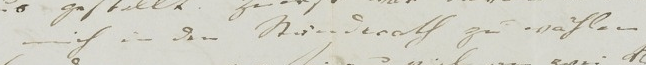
& mich in den Ständerath zu wählen.
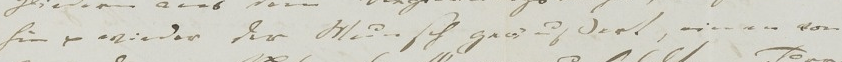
hin & wieder der Wunsch geäußert, einen von
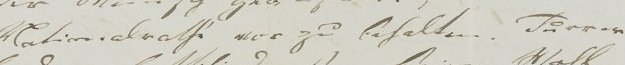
Nationalrathe vor zu behalten. Furrer
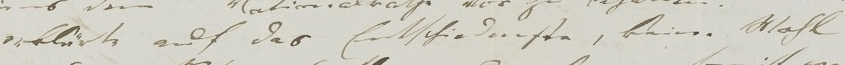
erklärte auf das Entschiedenste, keine Wahl
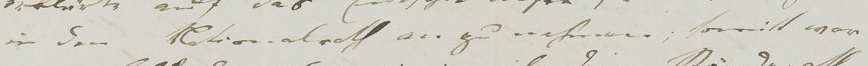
in den Nationalrath an zu nehmen; somit war
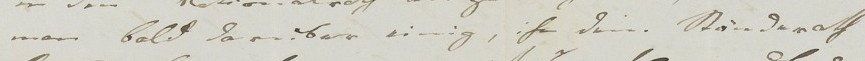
man bald darüber einig, ihn dem Ständerath
